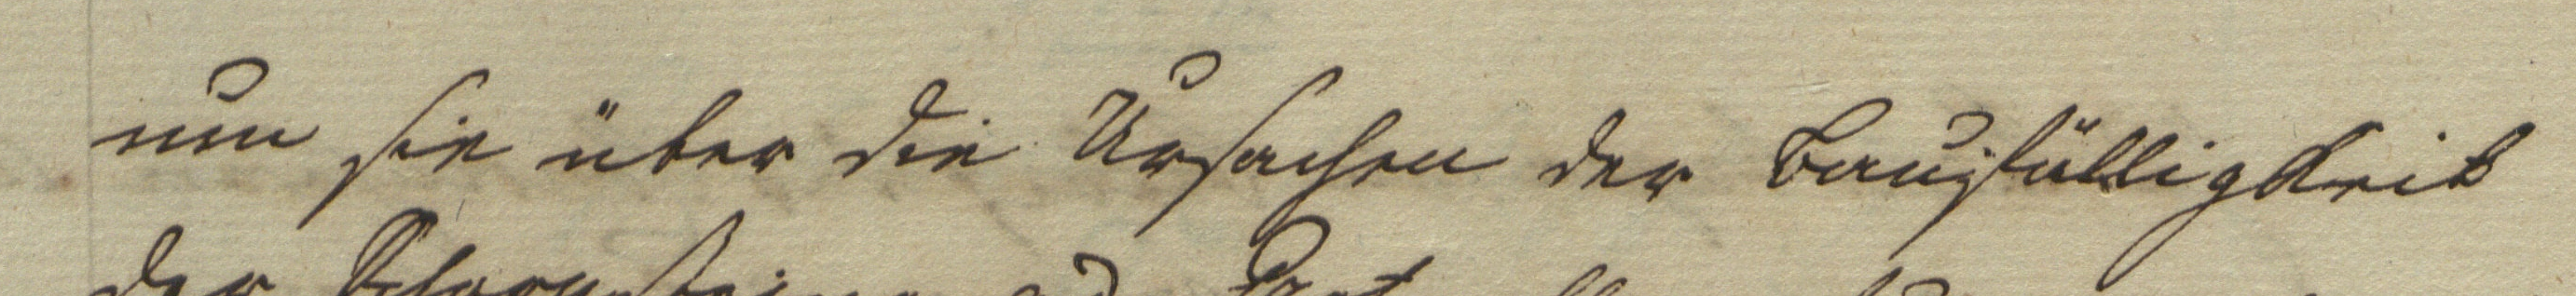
um sie über die Ursachen der Baufälligkeit
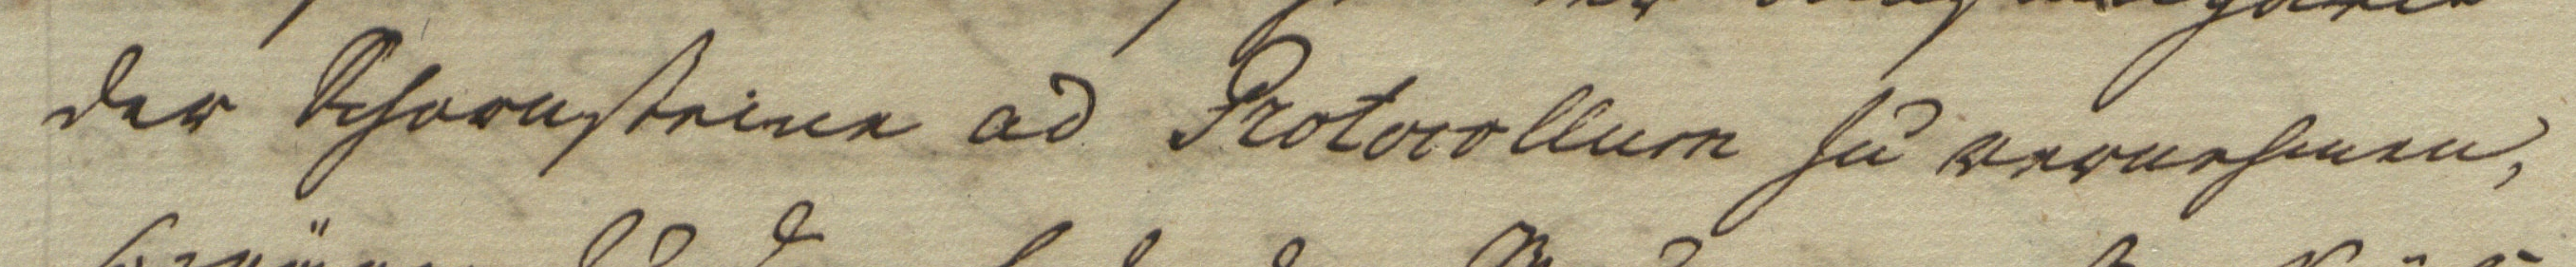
der Schornsteine ad Protocollum zu vernehmen,
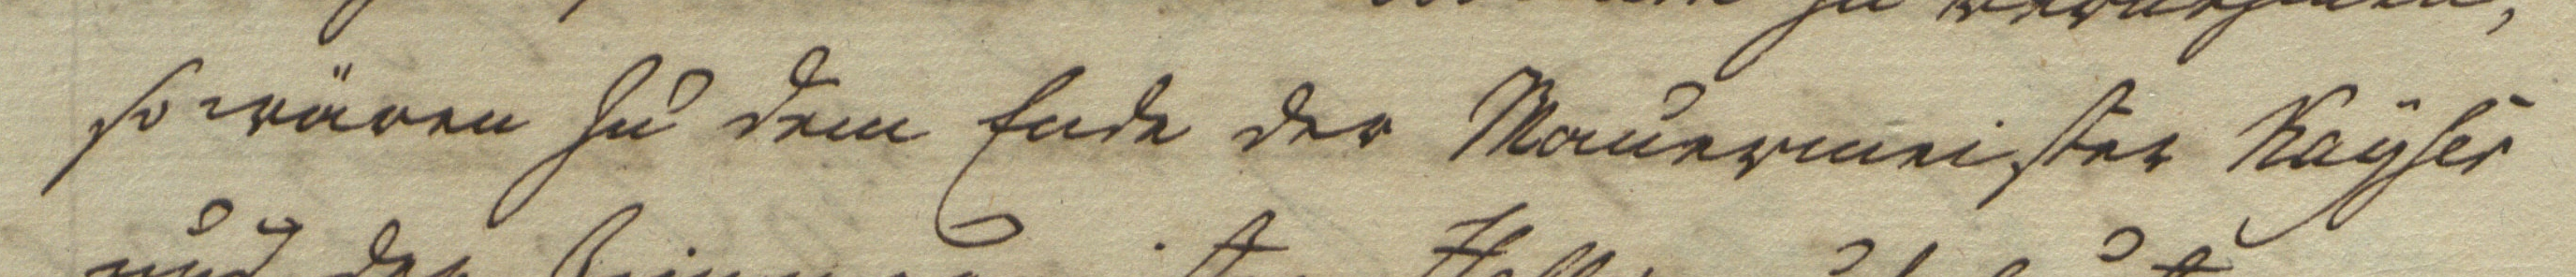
so wären zu dem Ende der Mauermeister Kaÿser
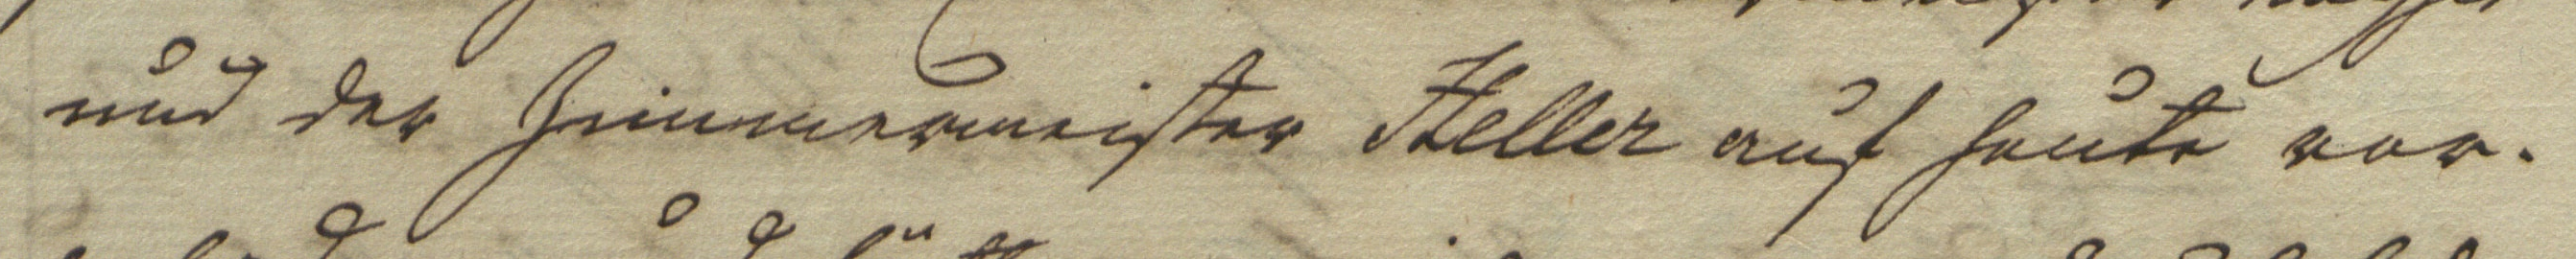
und der Zimmermeister Heller auf heute vor¬
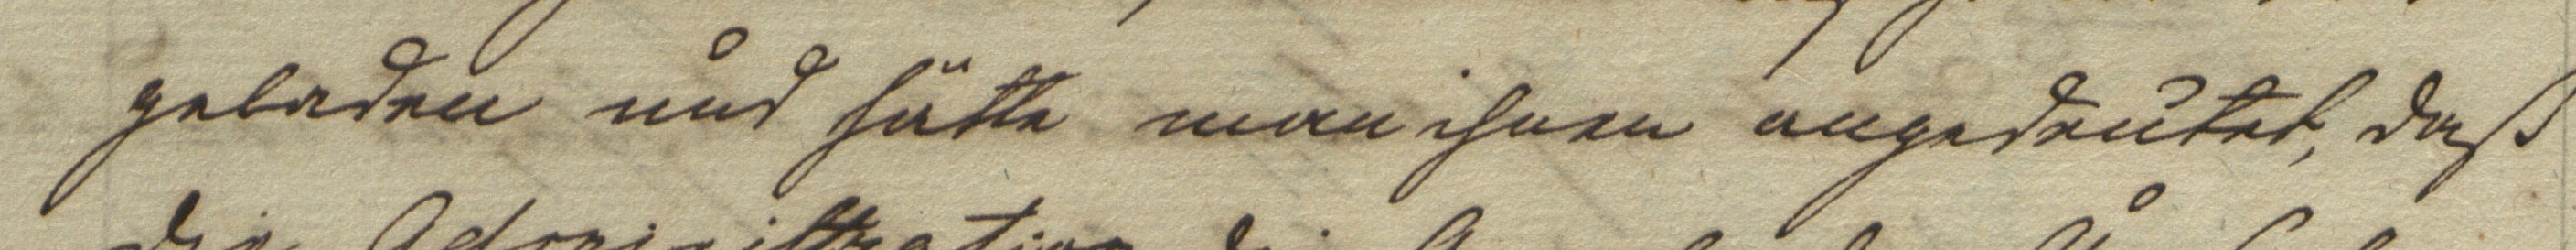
geladen und hätte man ihnen angedeutet, daß
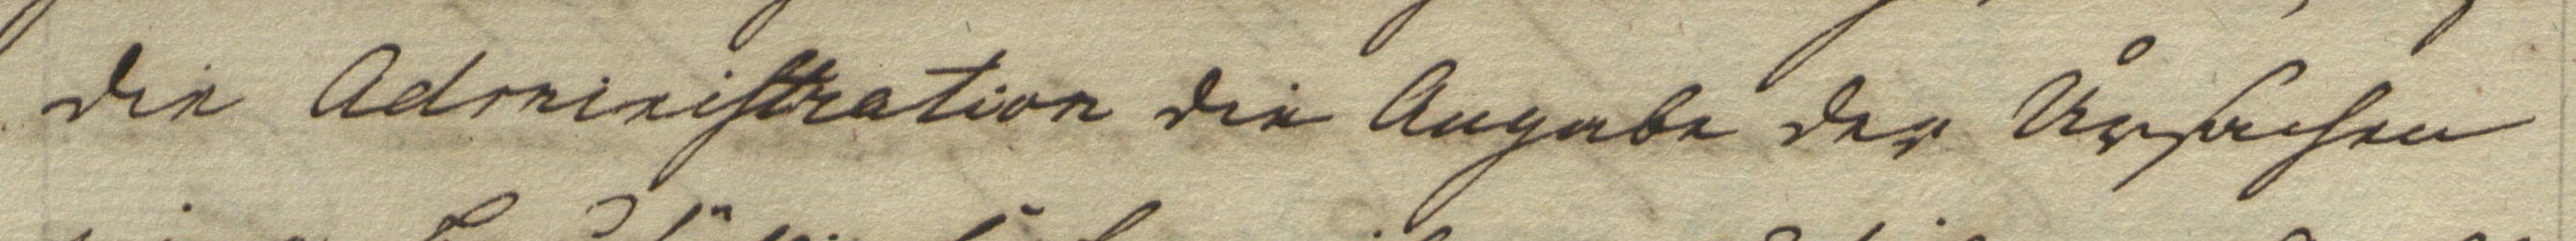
die Administration die Angabe der Ursachen
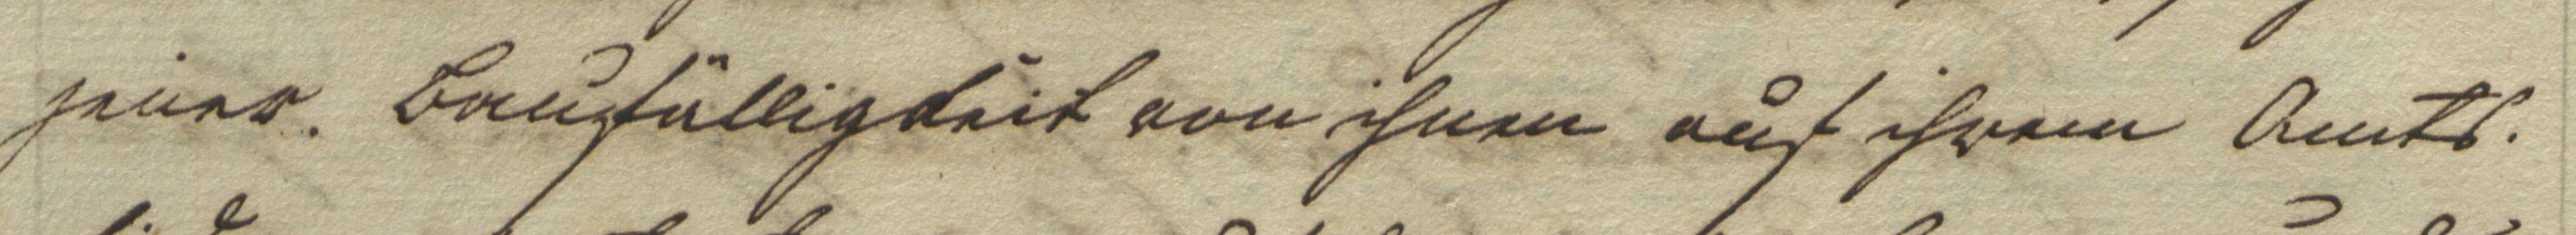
jener Baufälligkeit von ihnen auf ihrem Amts¬
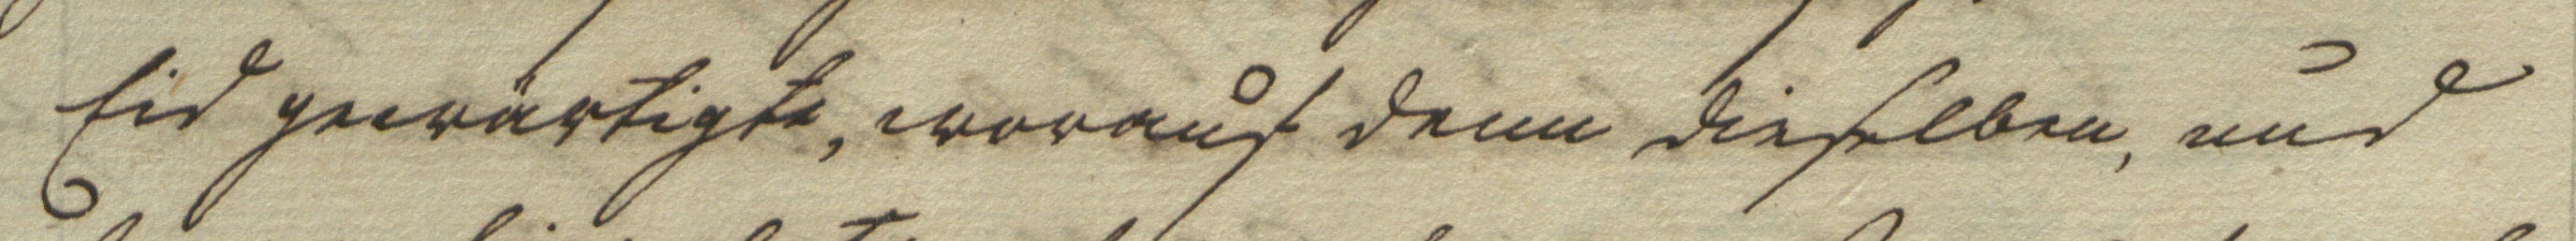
Eid gewärtigte, worauf denn dieselben, und
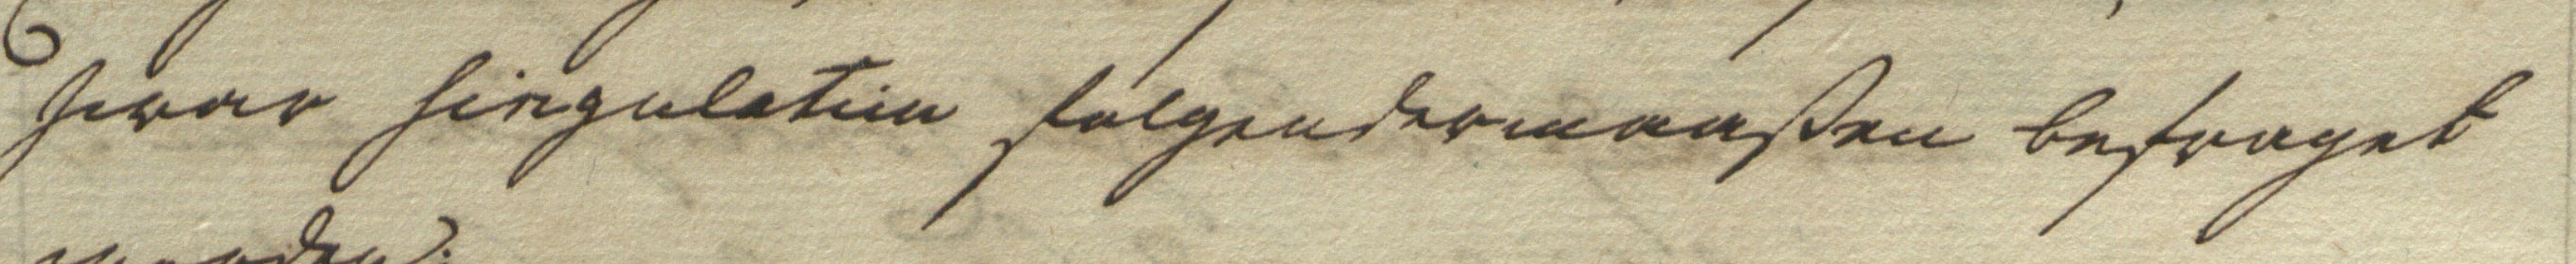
zwar singulatim folgendermaaßen befraget
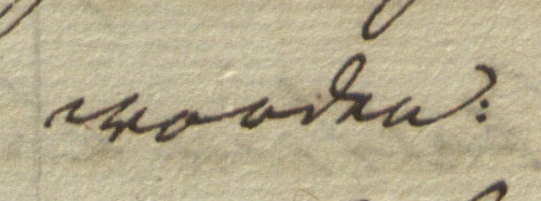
worden:
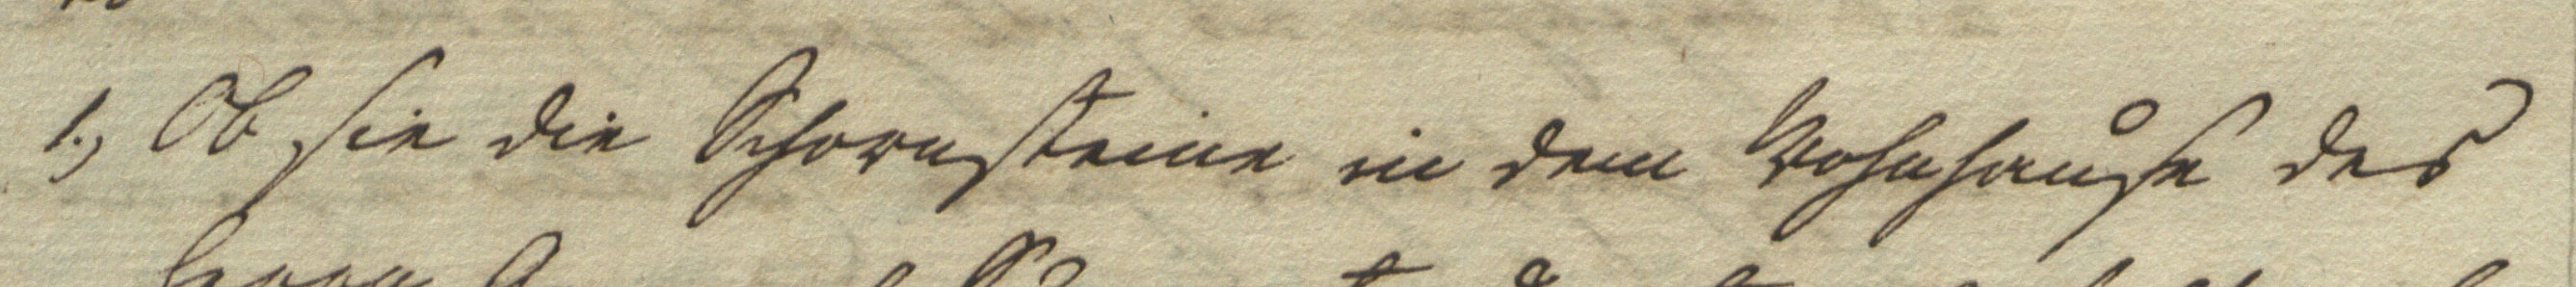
1., Ob sie die Schornsteine in dem Wohnhause des
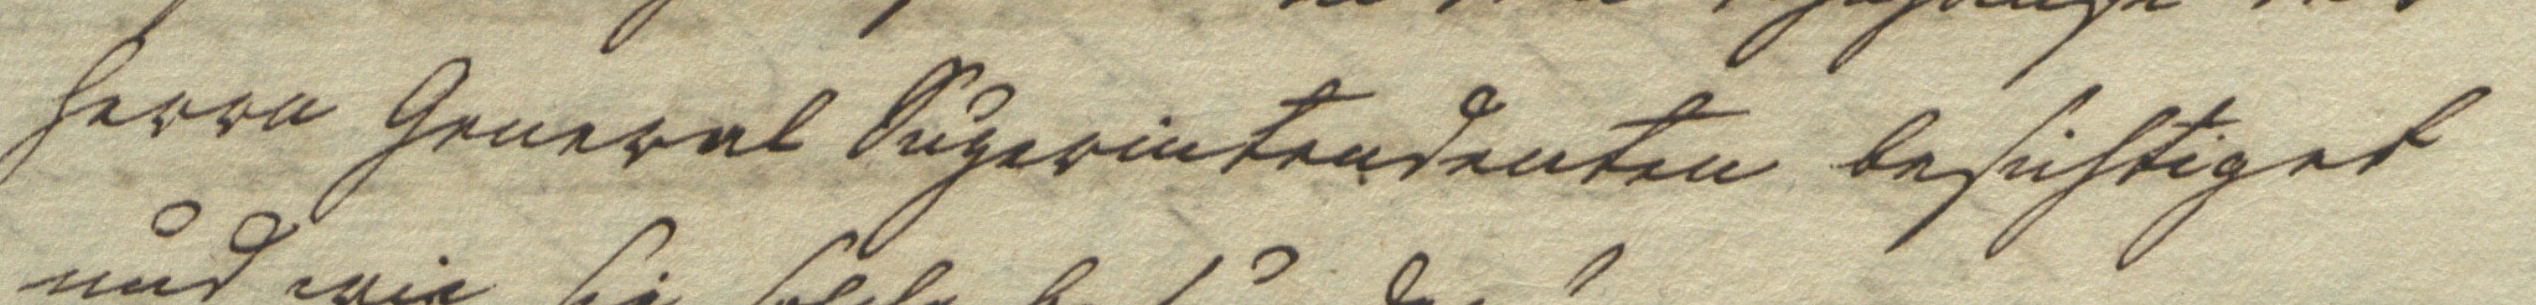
Herrn General Superintendenten besichtiget
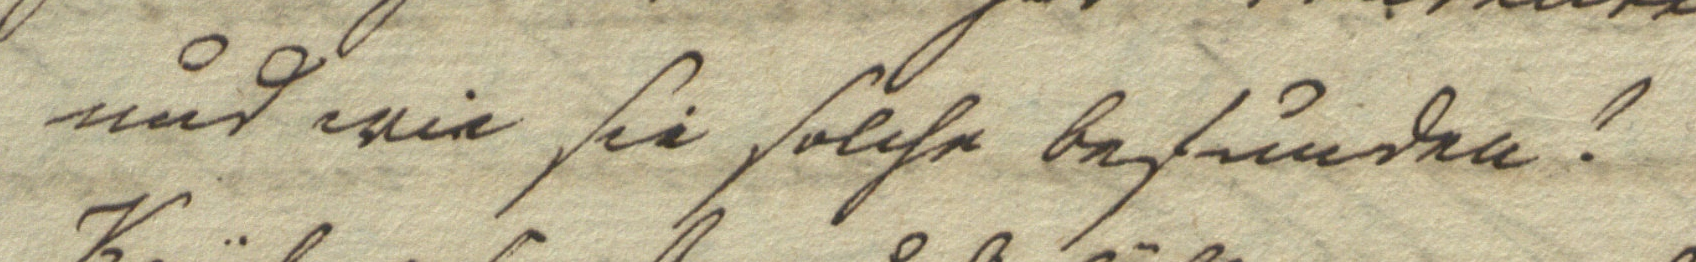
und wie sie solche befunden?
